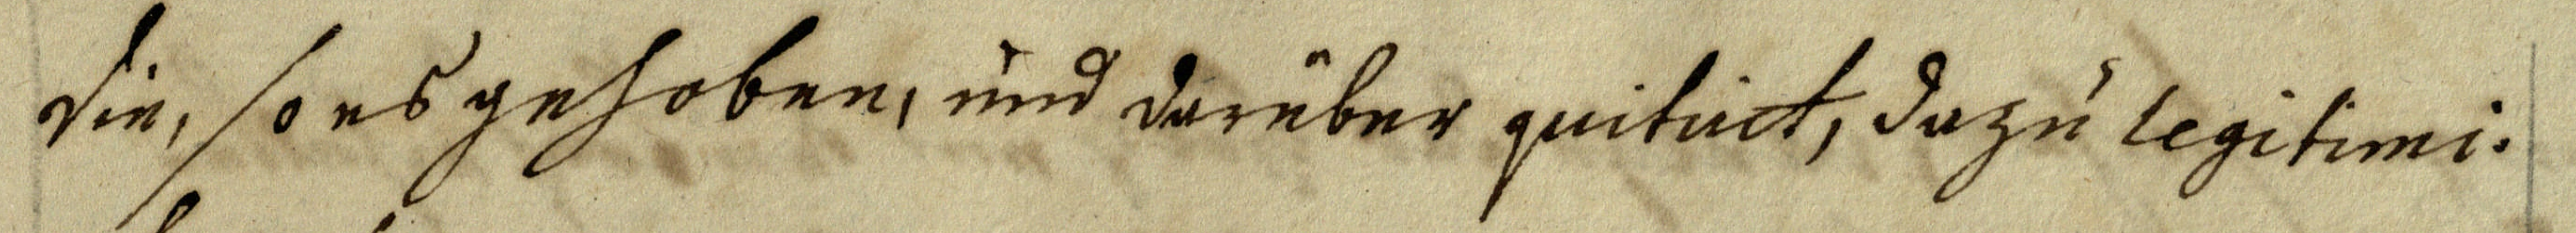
die, so es gehoben, und darüber quittiret, dazu legitimi¬
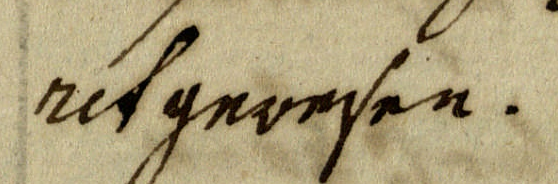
ret gewesen.
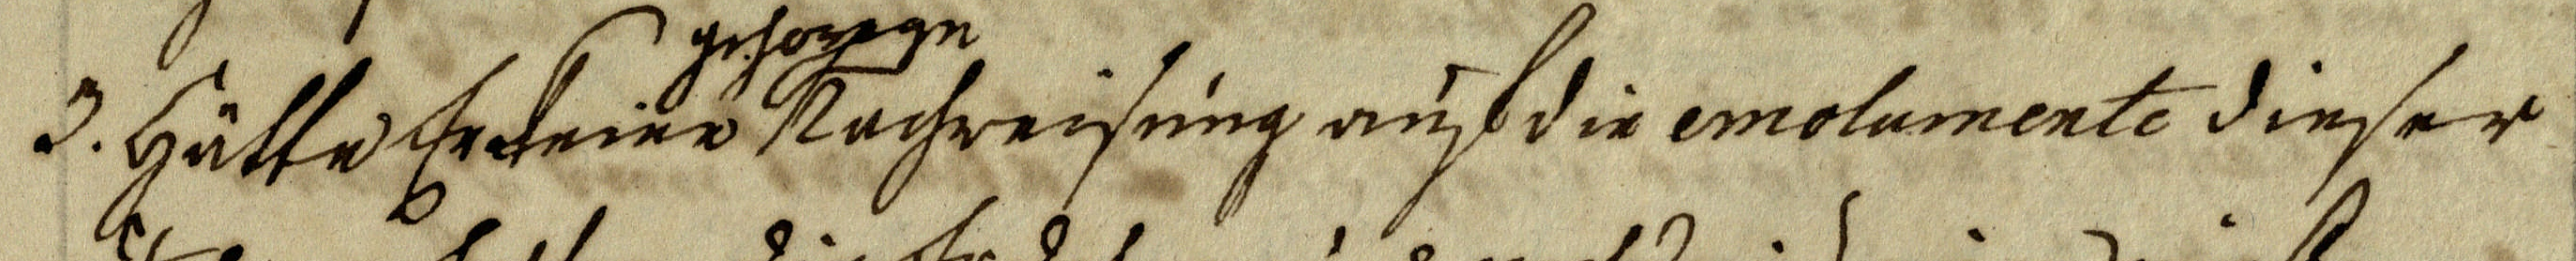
3. Hätte Er keine gehörige Nachweisung auf die emolumente dieser
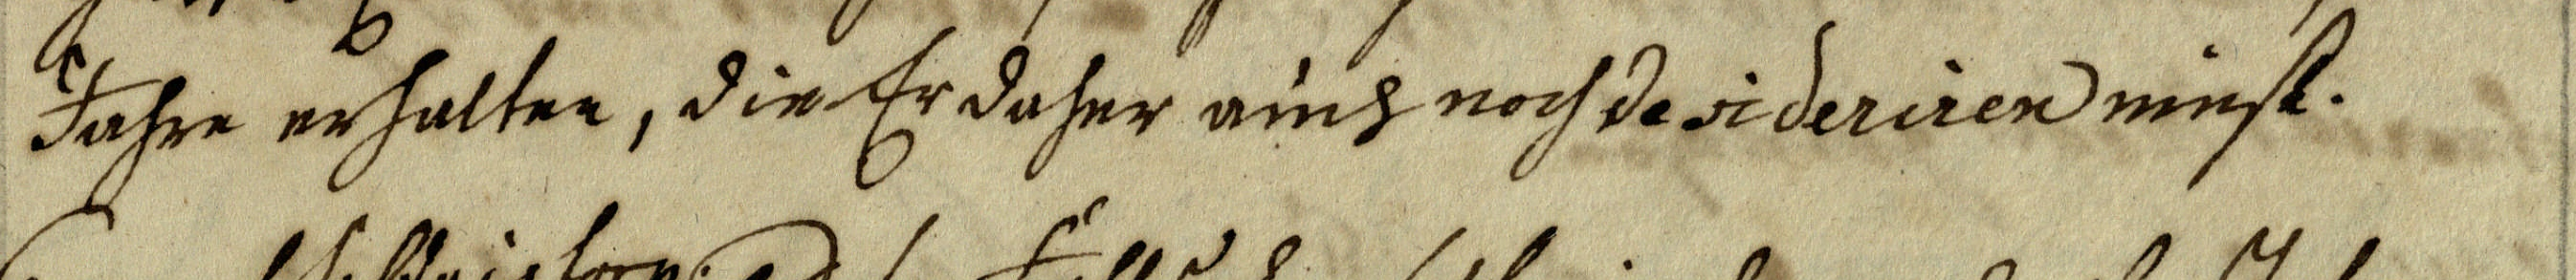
Jahre erhalten, die Er daher auch noch desideriren müße.
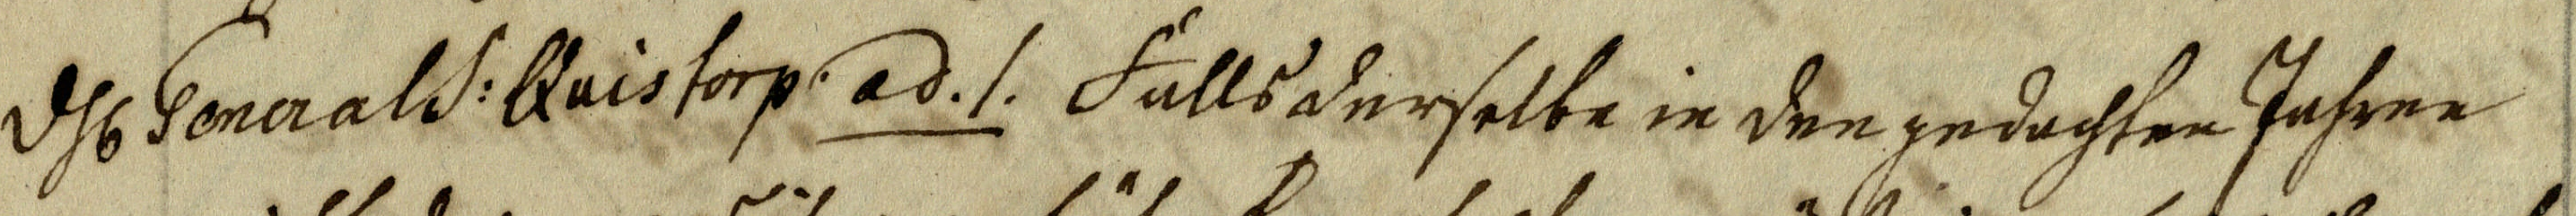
dh GeneralS. Quistorp ad. 1. Falls derselbe in den gedachten Jahren
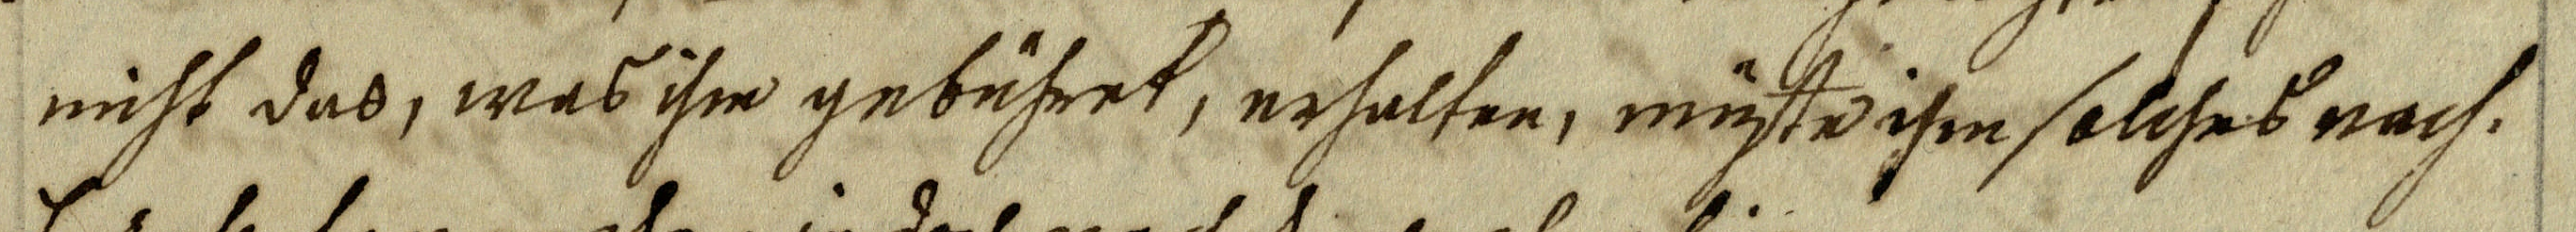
nicht das, was ihm gebühret, erhalten, müßte ihm solches nach¬
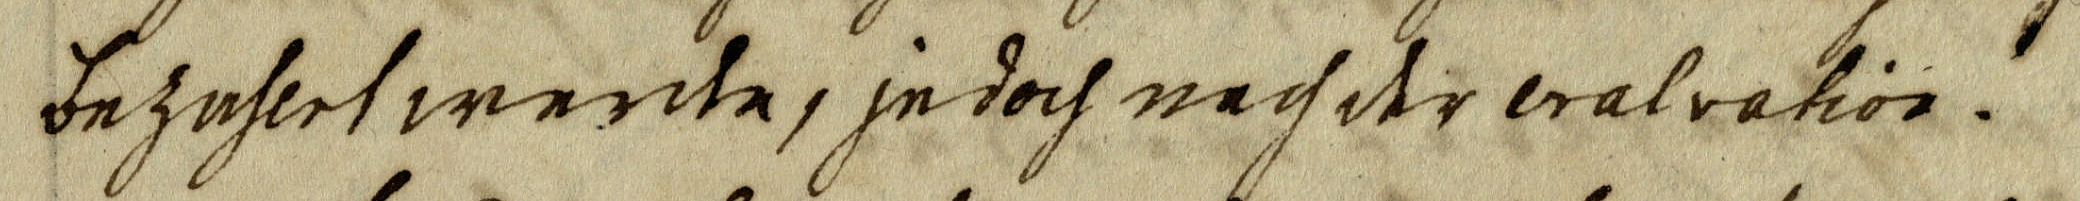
bezahlet werden, jedoch nach der eratration.
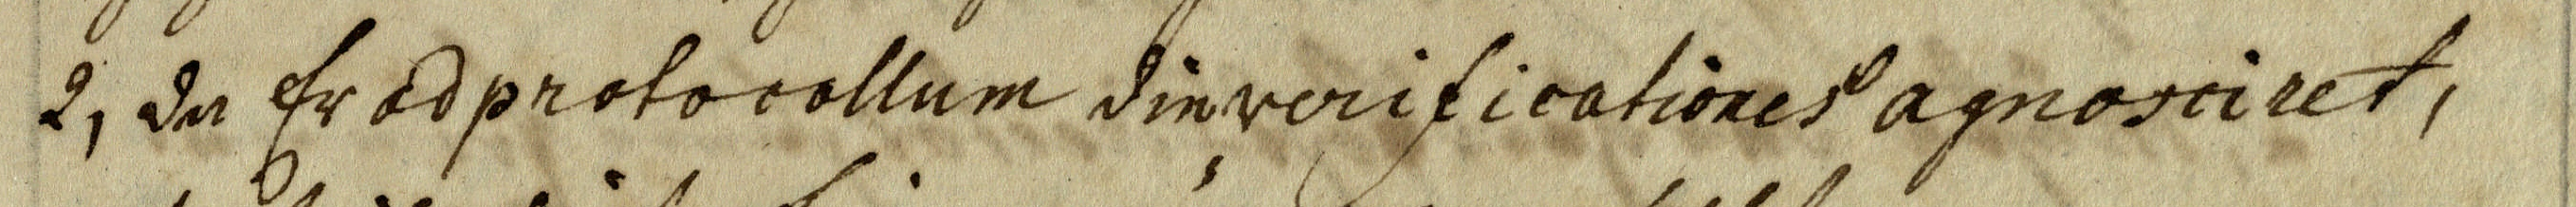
2, da Er ad protocollum die verificationes agnosciret,
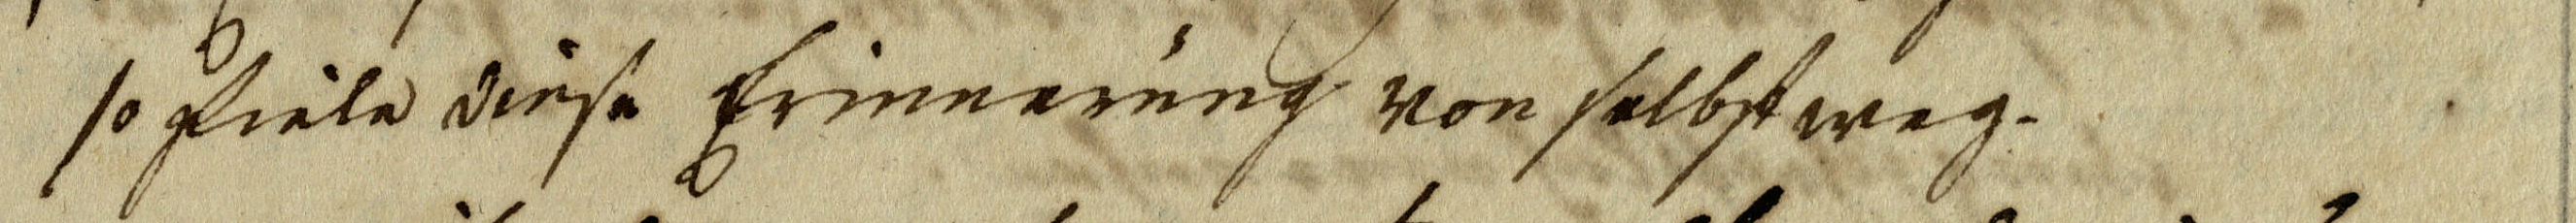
so fiele diese Erinnerung von selbst weg.
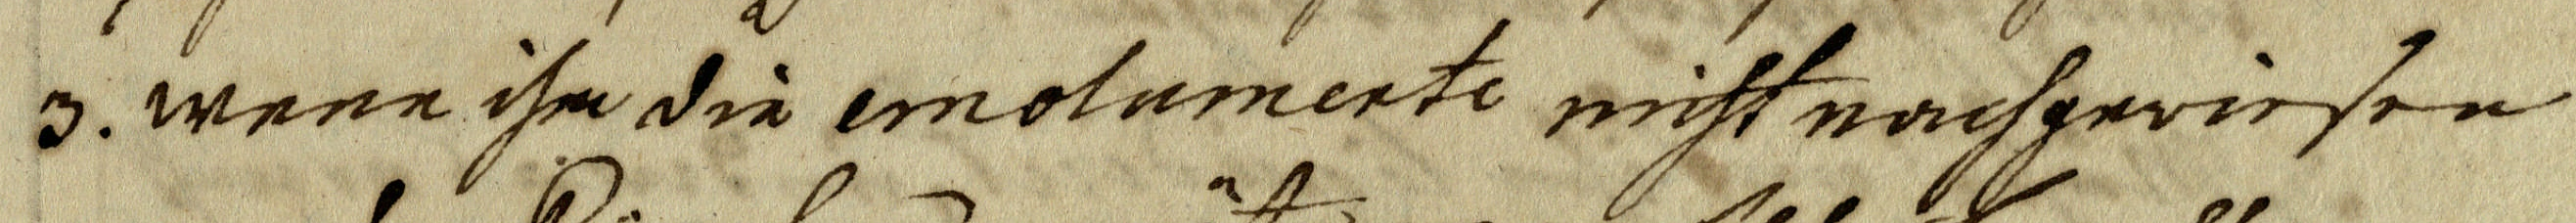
3. wenn ihm die emolumente nicht nachgewiesen
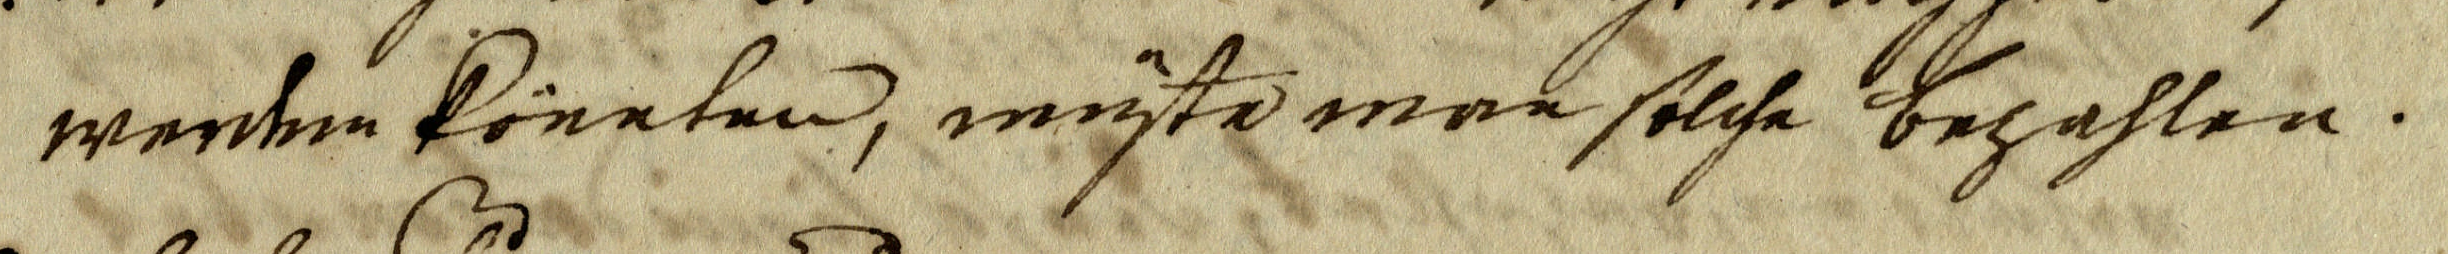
werden könnten, müßte man solche bezahlen.
